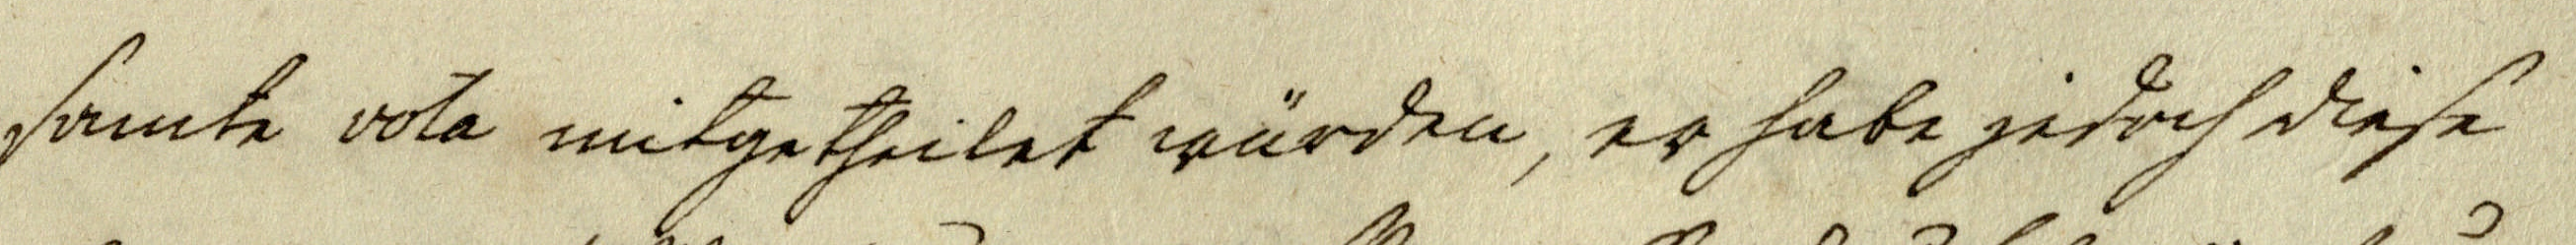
samte vota mitgetheilet würden, er habe jedoch diese
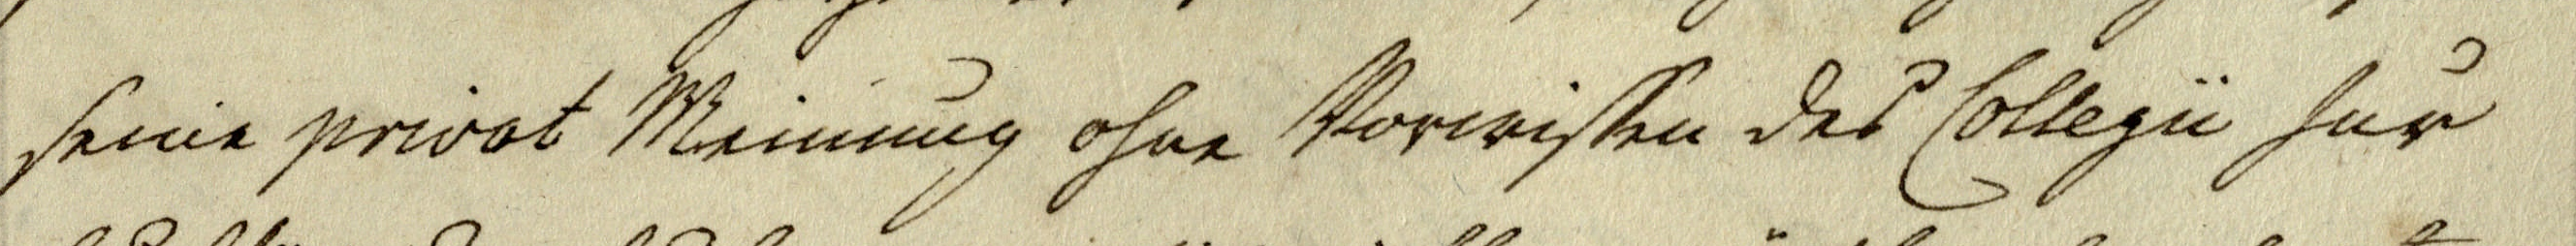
seine privat Meinung ohne Vorwissen des Collegii zur
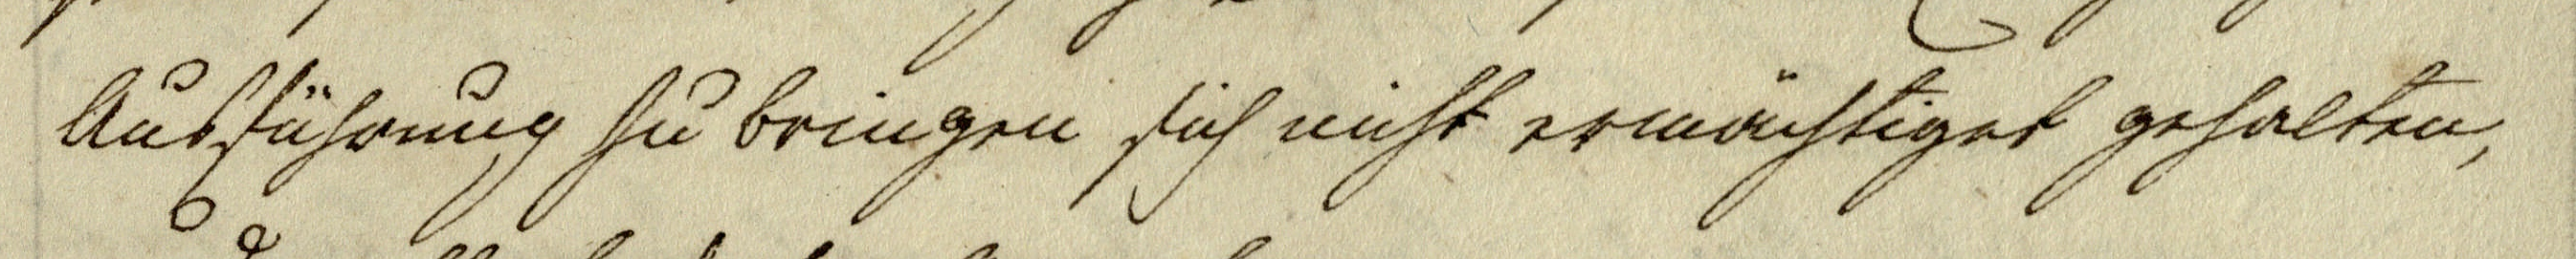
Ausführung zu bringen sich nicht ermächtiget gehalten,
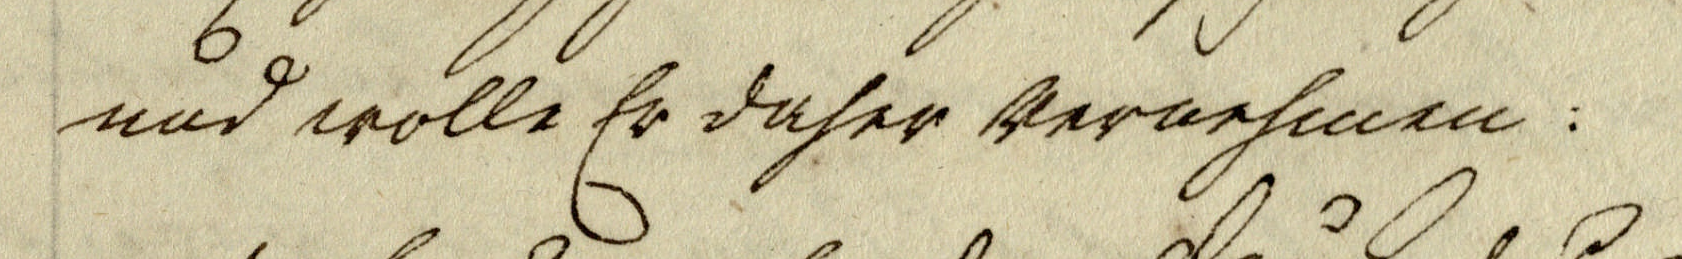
und wolle Er daher vernehmen:
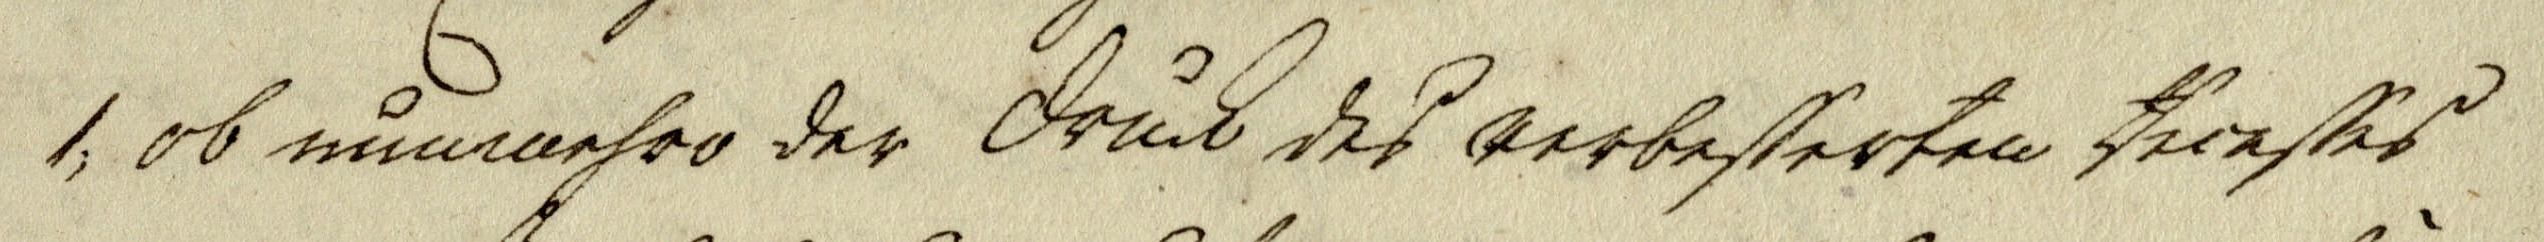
1, ob nunmehro der Druck des verbesserten Recesses
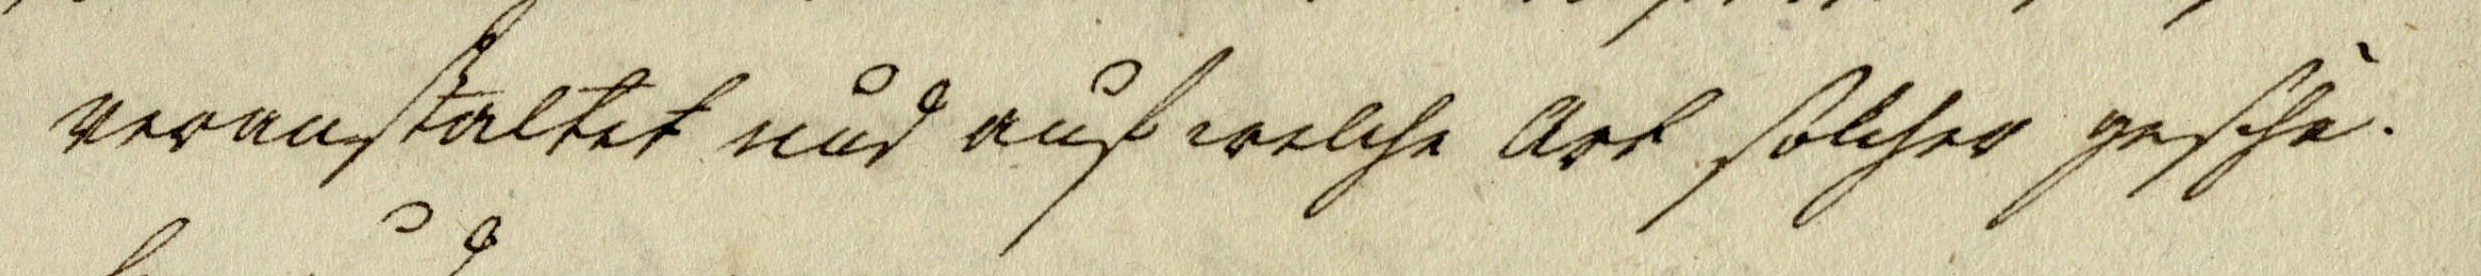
veranstaltet und auf welche Art solches gesche¬
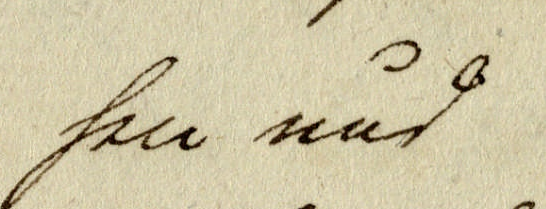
chen und
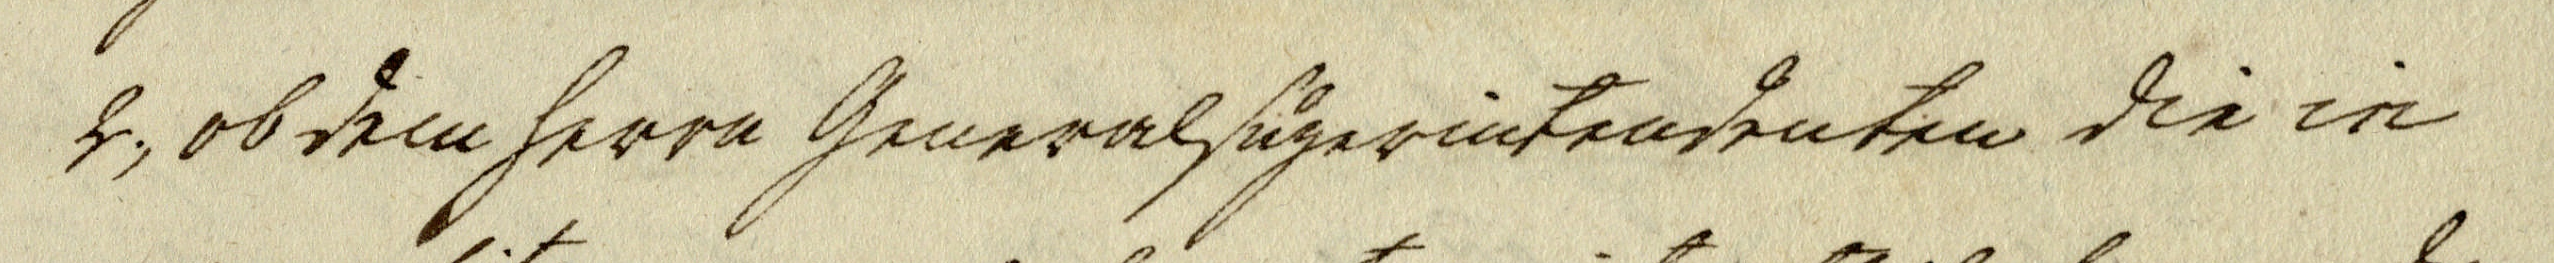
2., ob dem Herrn Generalsuperintendenten die in
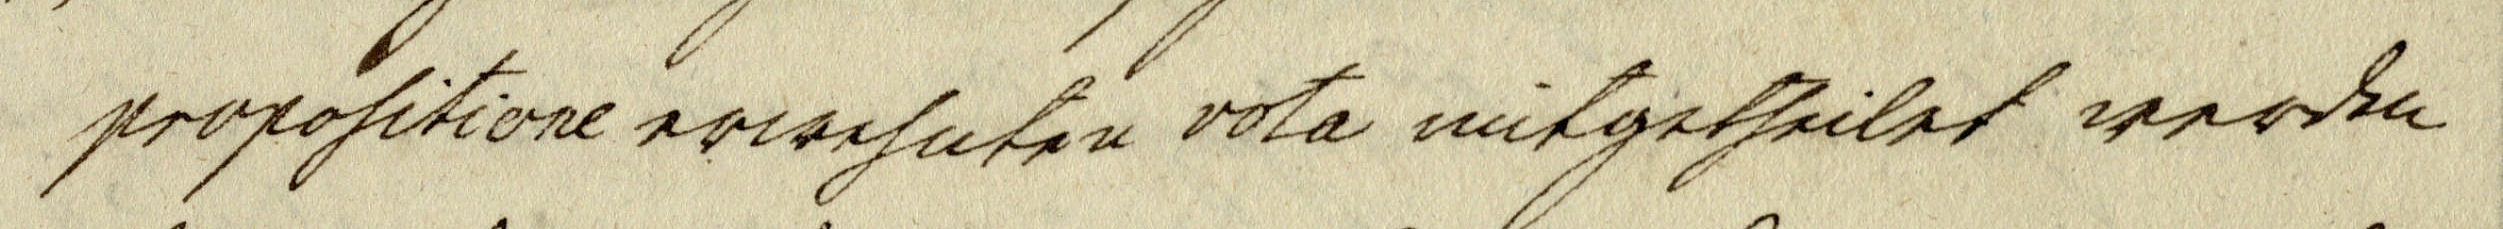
propositione erwehnten vota mitgetheilet werden
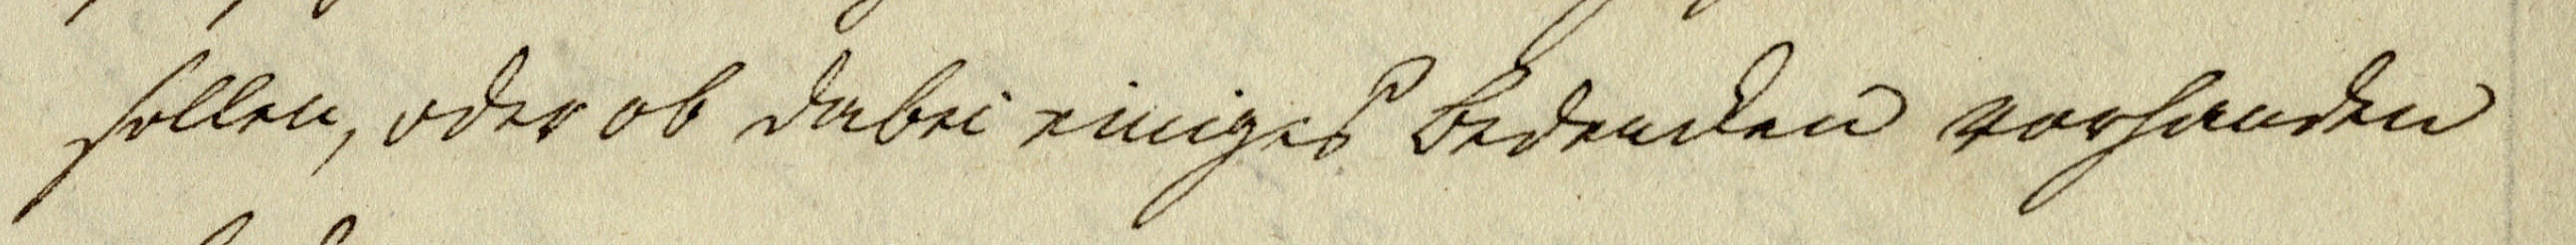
sollen, oder ob dabei einiges Bedencken vorhanden
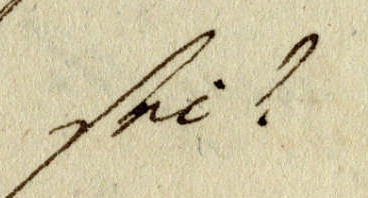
sei?
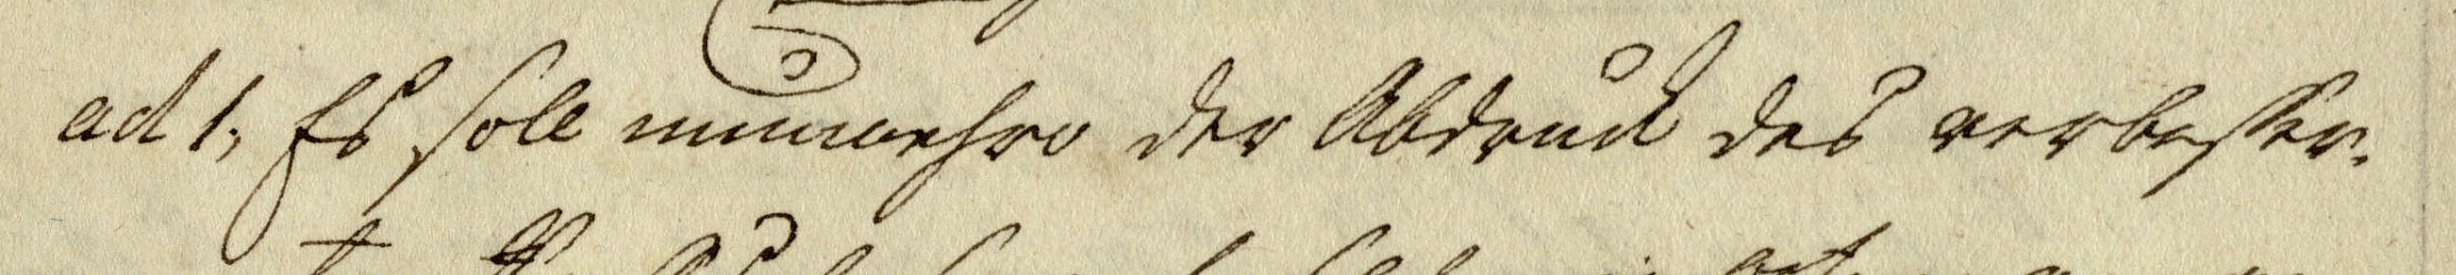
ad 1, Es soll nunmehro der Abdruck des verbesser¬
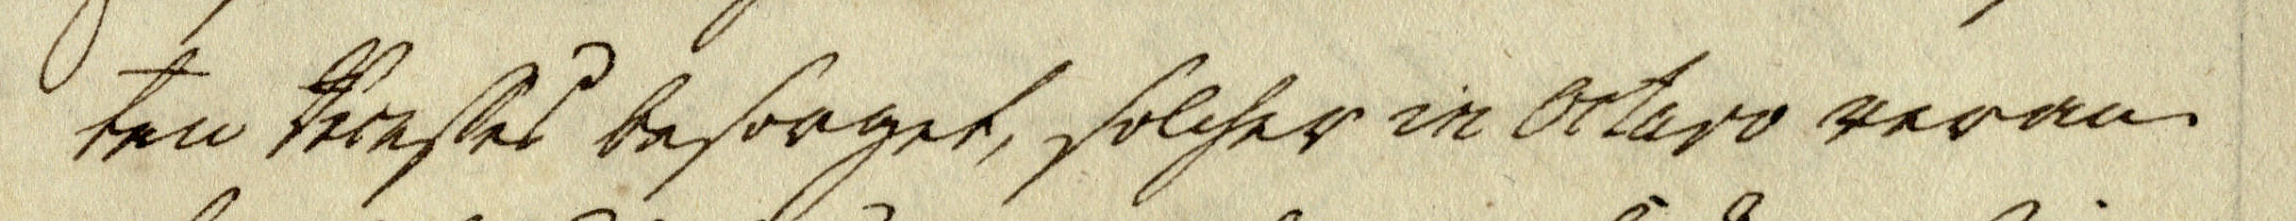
ten Recesses besorget, solcher in octavo veran¬
